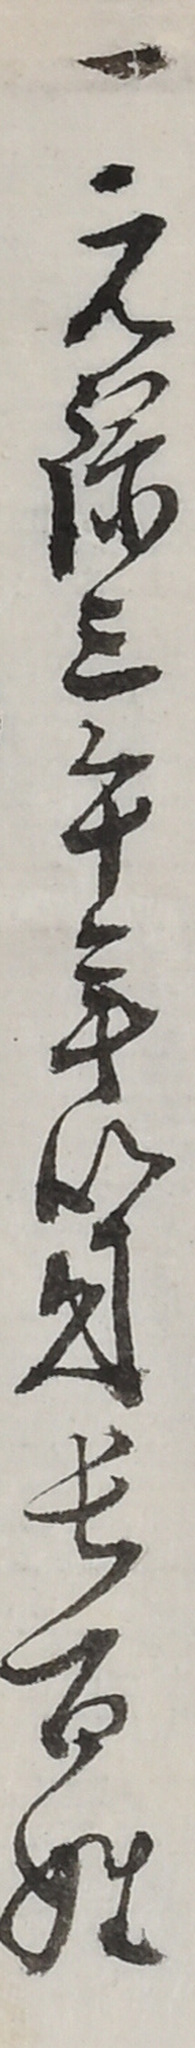一元禄三午年以来長百姓
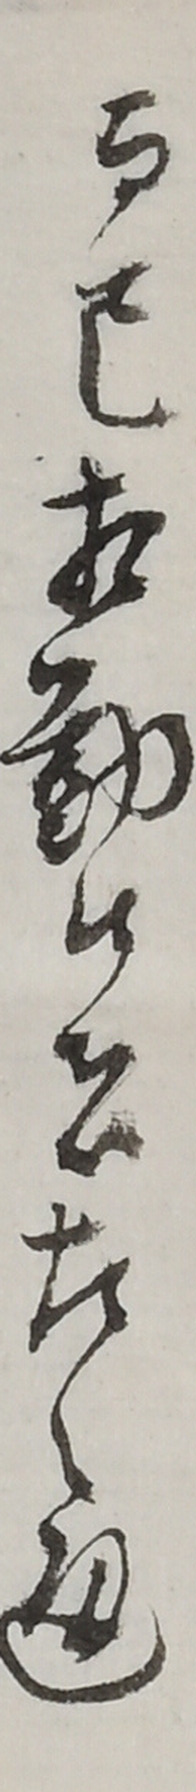而已相勤候は左之通
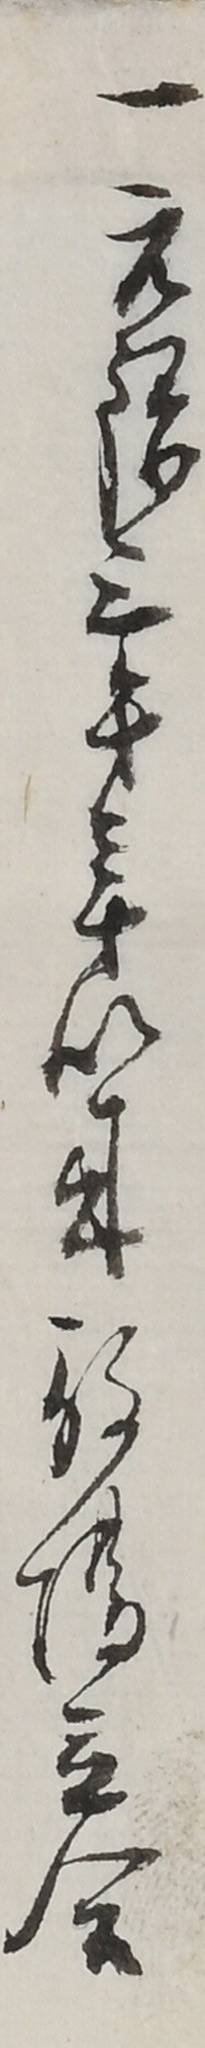一元禄三午年以来役場立合

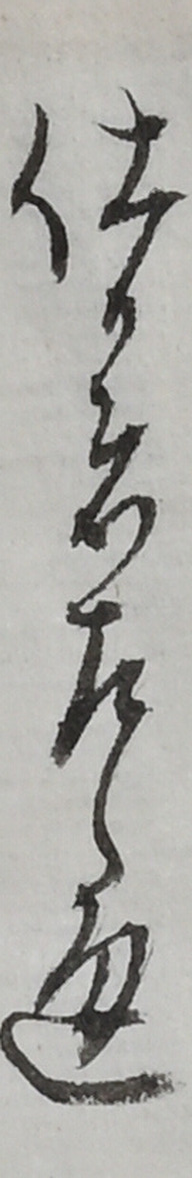仕候者左之通
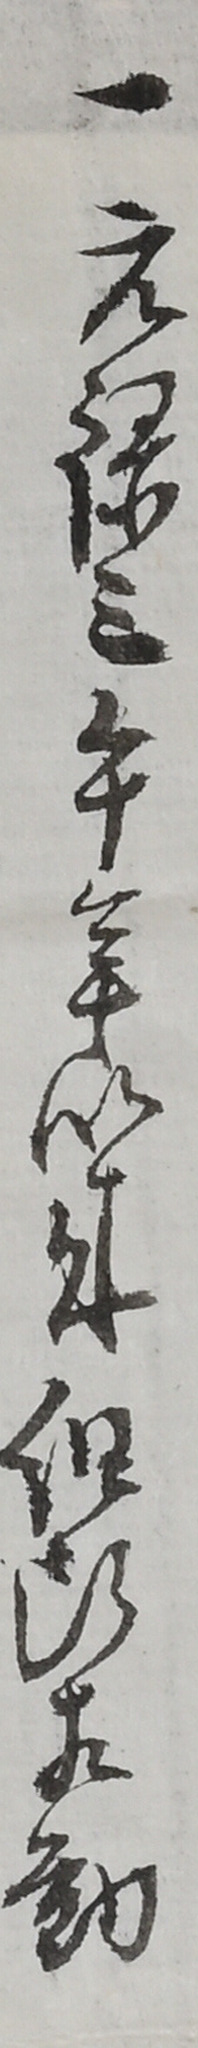一元禄三午年以来組頭相勤
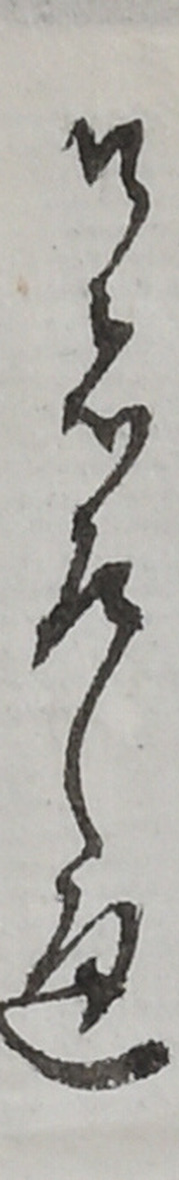候者左之通
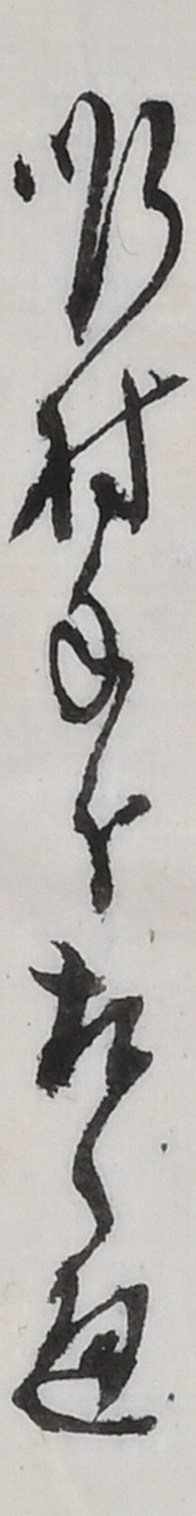順村手分左之通
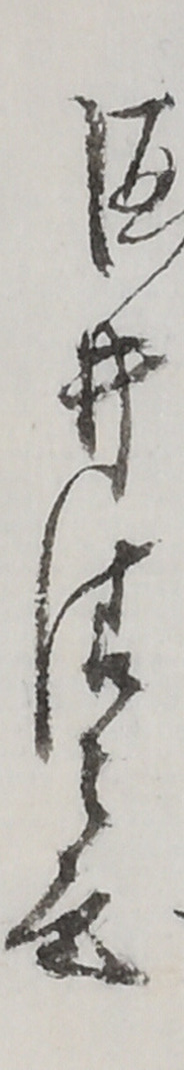酒井清之丞
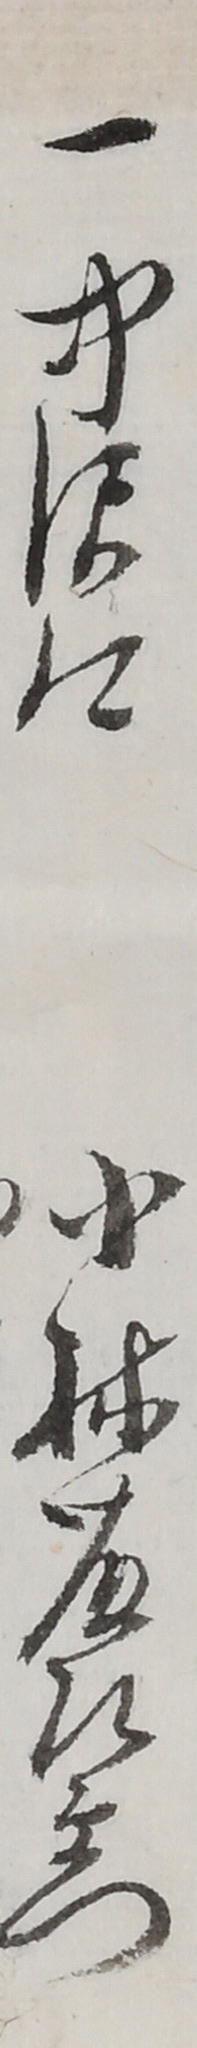一中沢郷小林藤左衛門
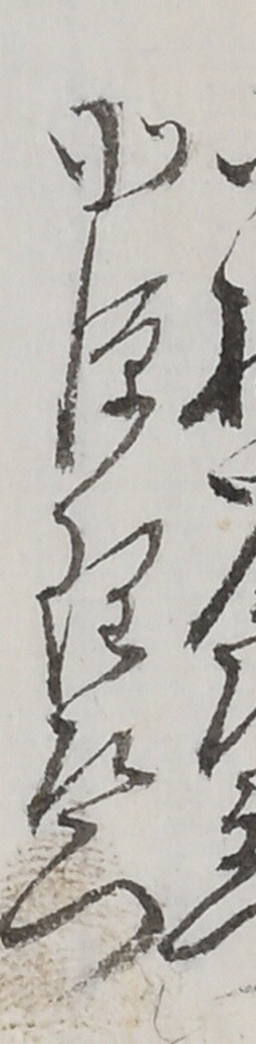北原理左衛門
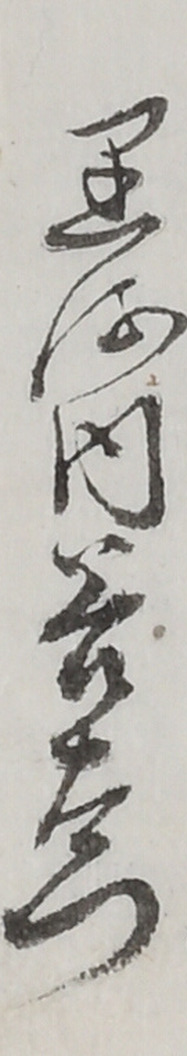黒河内谷右衛門

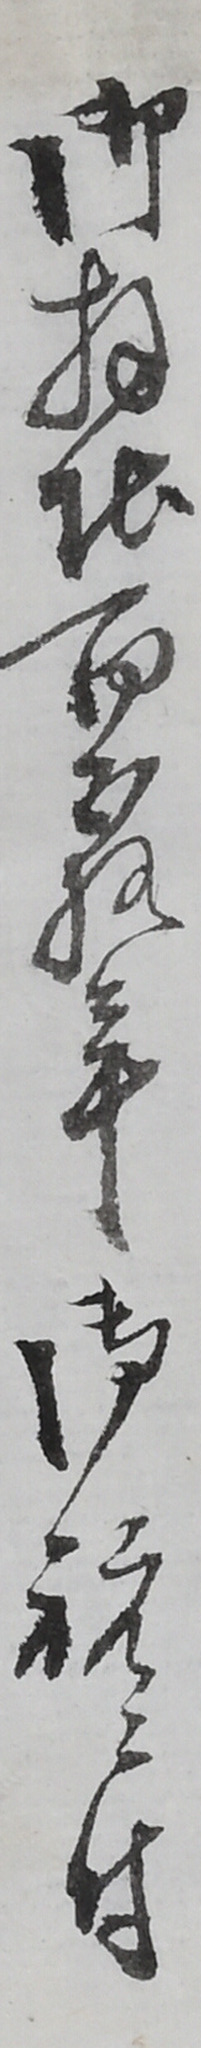御拝地百五拾年御祝ニ付
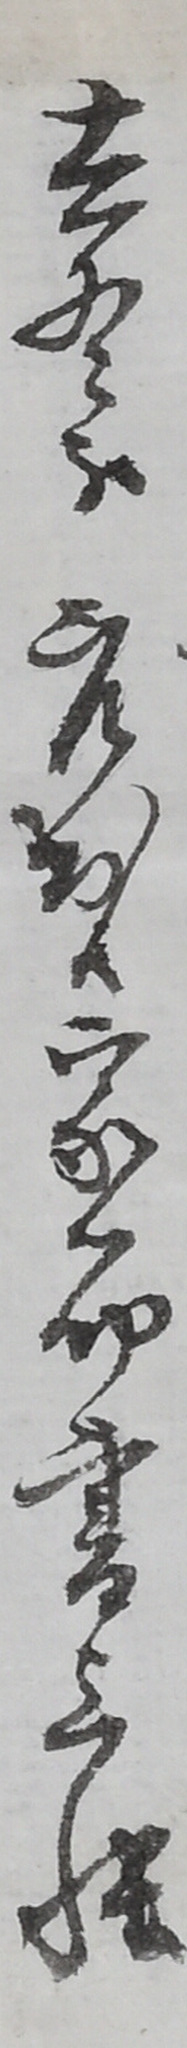去冬被左出候家筋書上帳
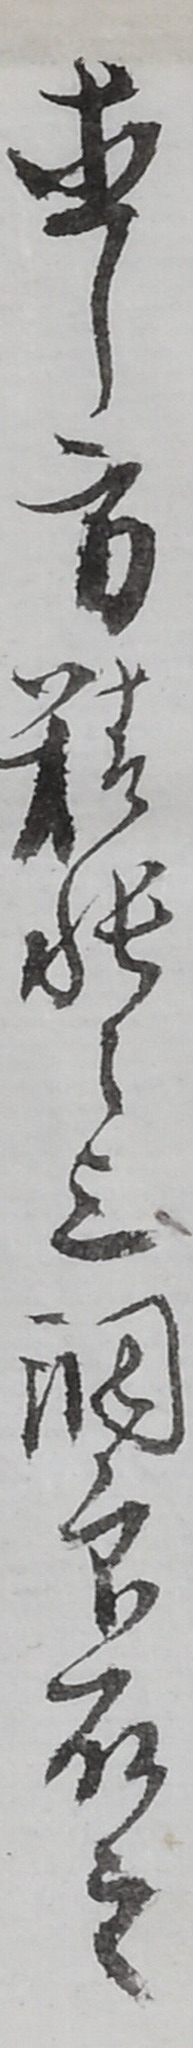直し方精帳之上調印有之
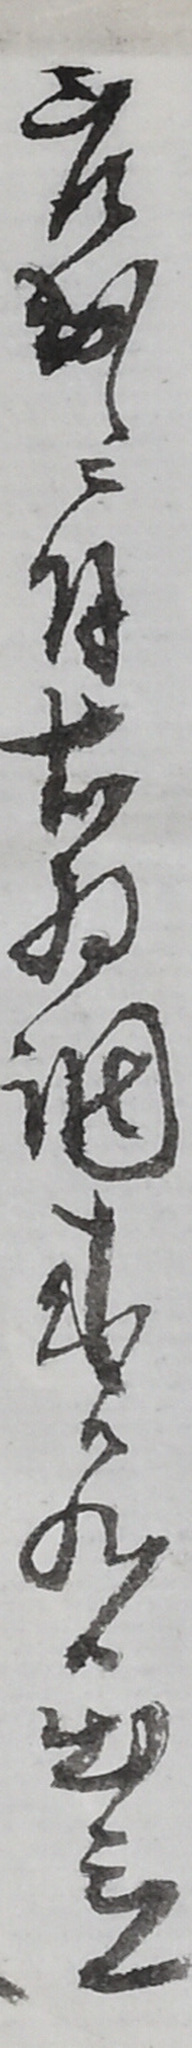差出し候ニ付右為調来ル九日出立
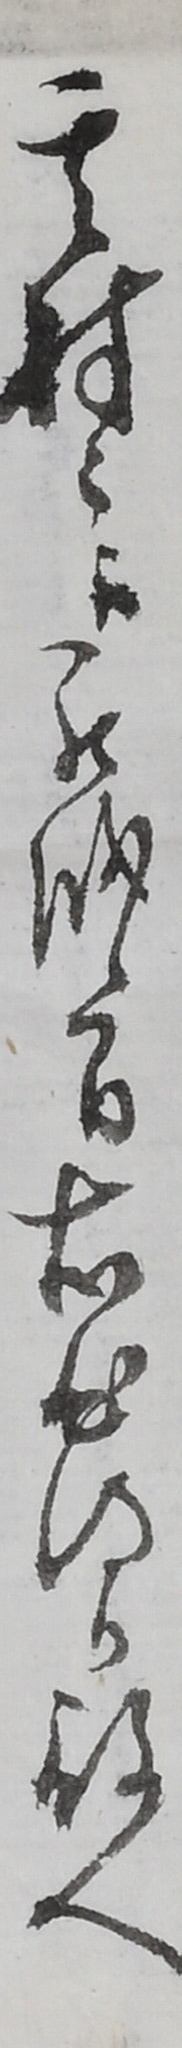其立々江罷越候間右心得候役人
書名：百五拾年御祝御用手控
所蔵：伊那市立高遠町図書館・合同会社AMANE
